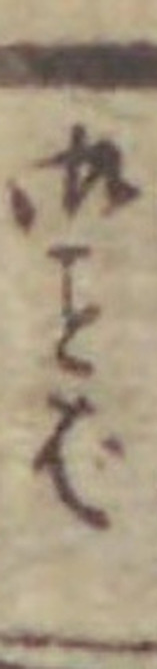御ことば
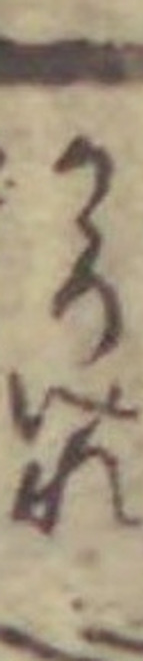かゝりけれ
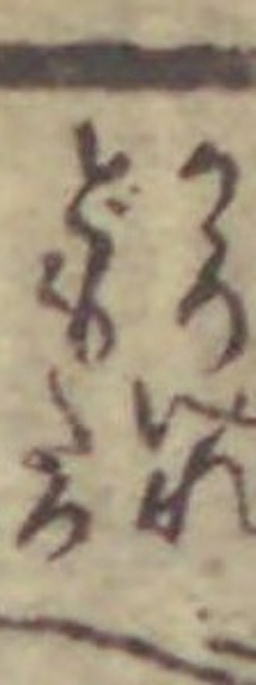どもたか
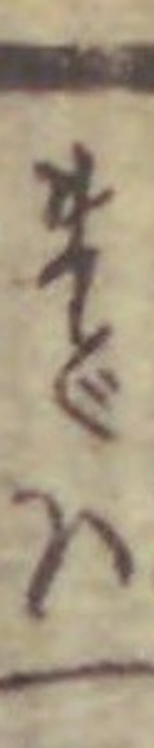まどは
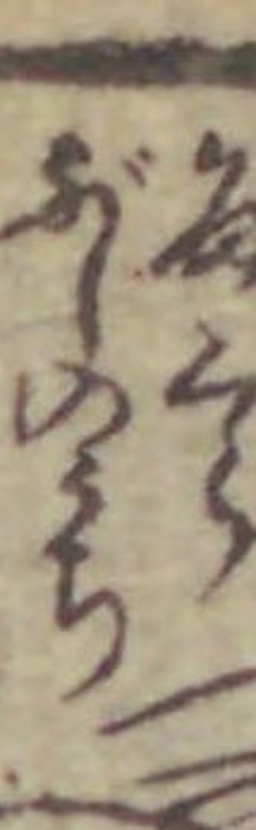ぶしのうち
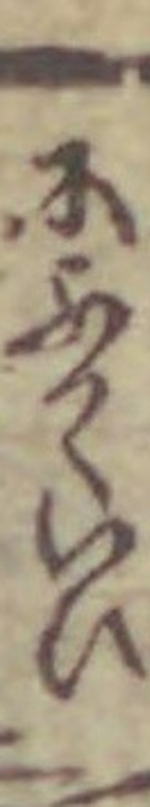にふかくいひ
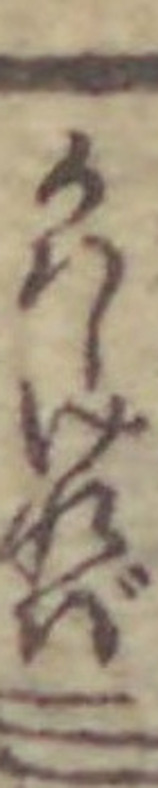かはしければ
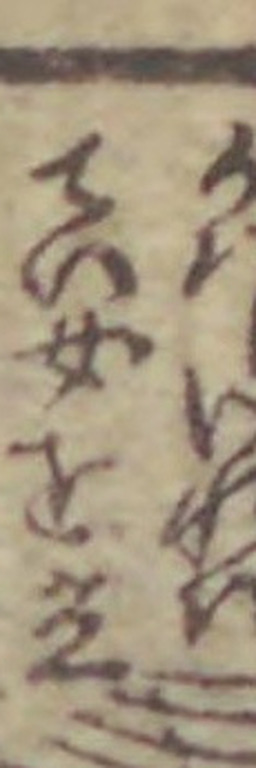てい女を立
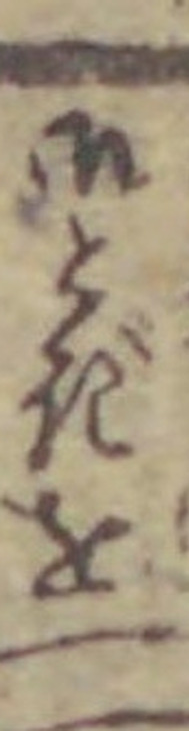御とぎを
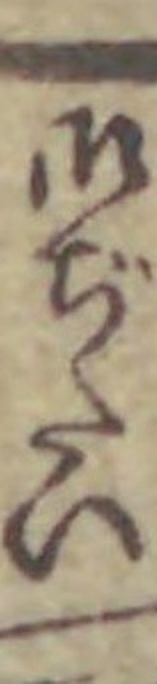御ぢたい
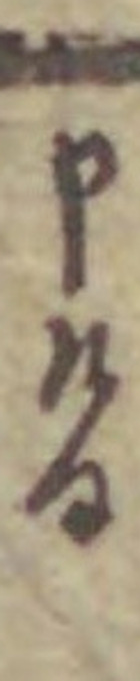申ける
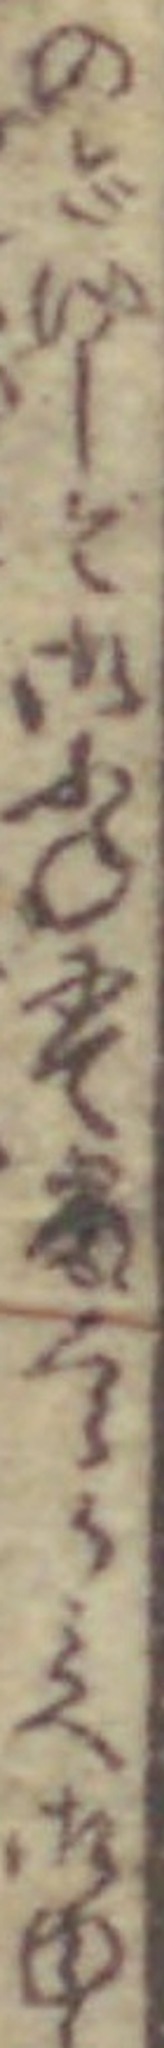のどけしと御ふねにてかまくらうみへ御ゆふ
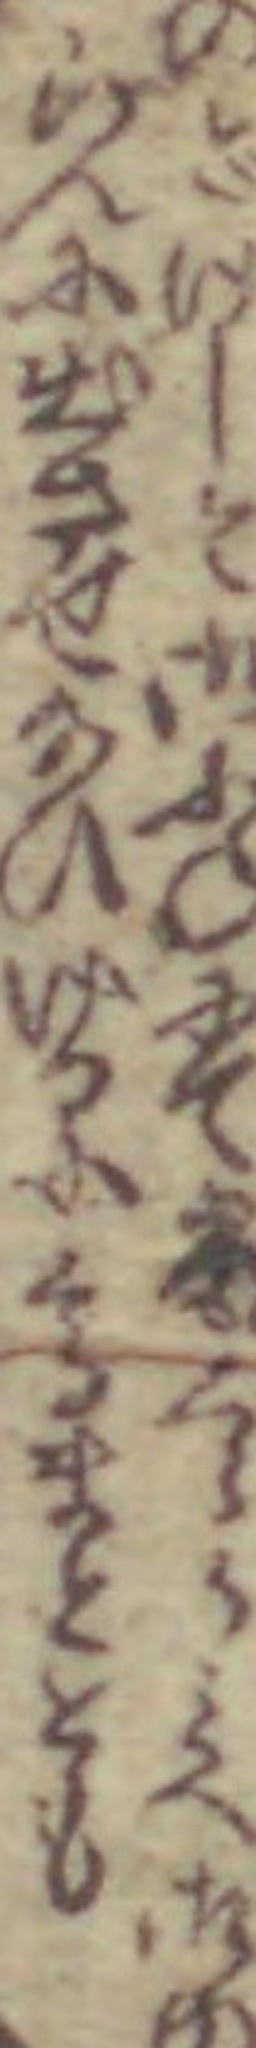らんに出させ給ひけるに高まととも
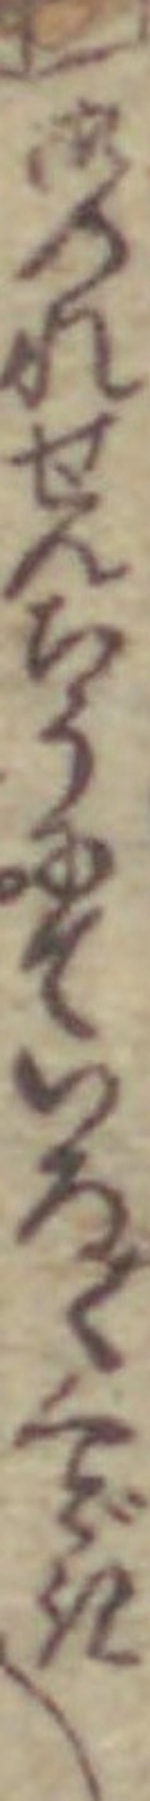御つれせんちうにていろ〳〵くどき
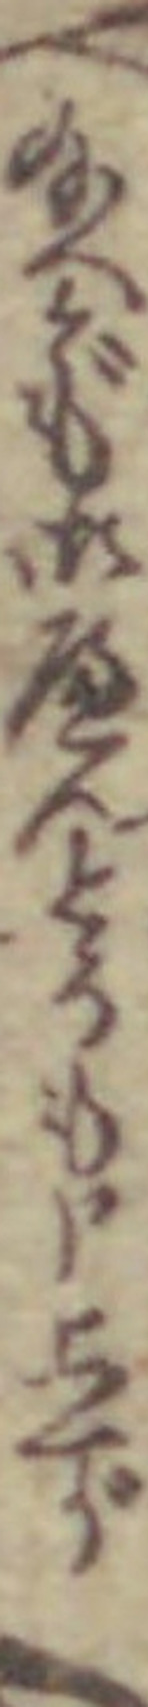給へども御へんとうも申上ず
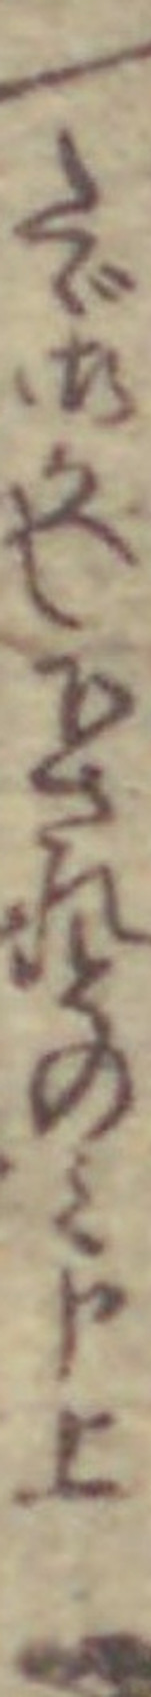たゞ御かへし下されとのみ申上
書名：鎌倉山紅葉浮名
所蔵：国立国会図書館 National Diet Library, JAPAN
